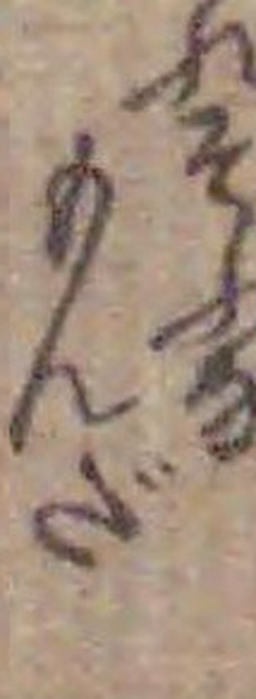もんだ

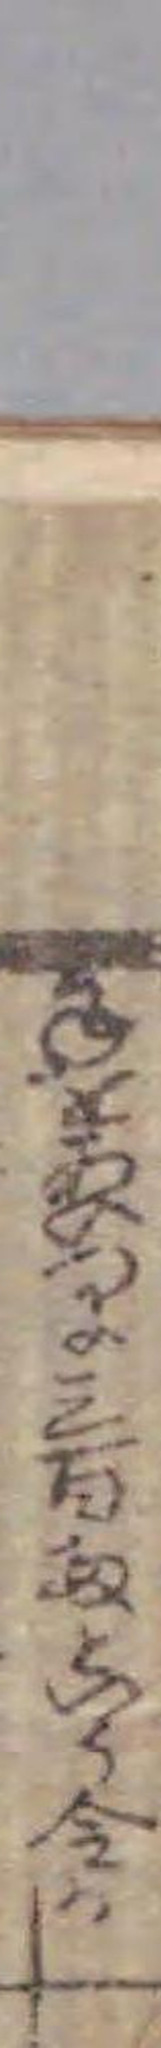かねをあいつに三百両という金か
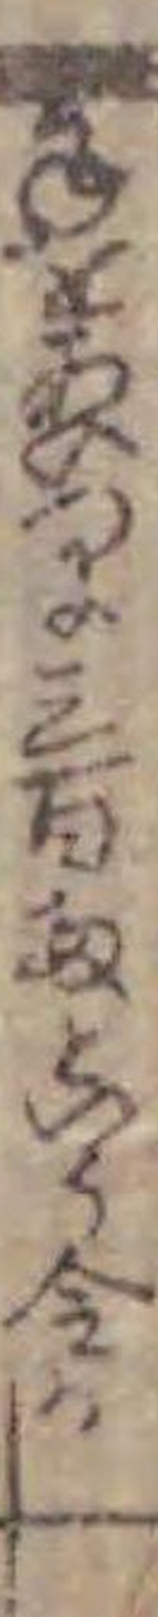かねをあいつに三百両という金か
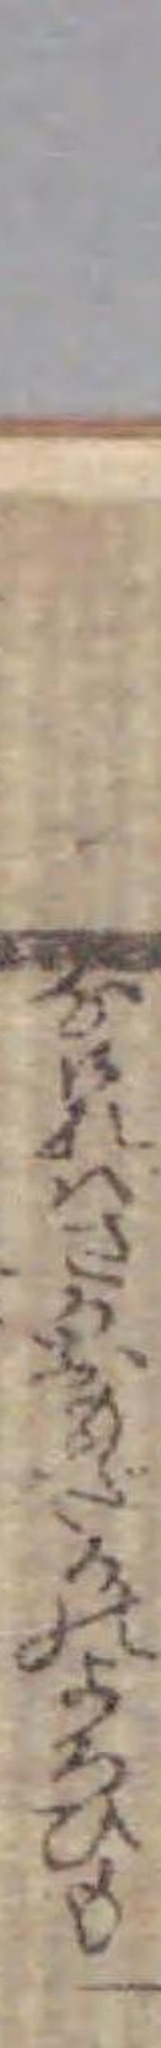なけれはさかおもだかのよろひも
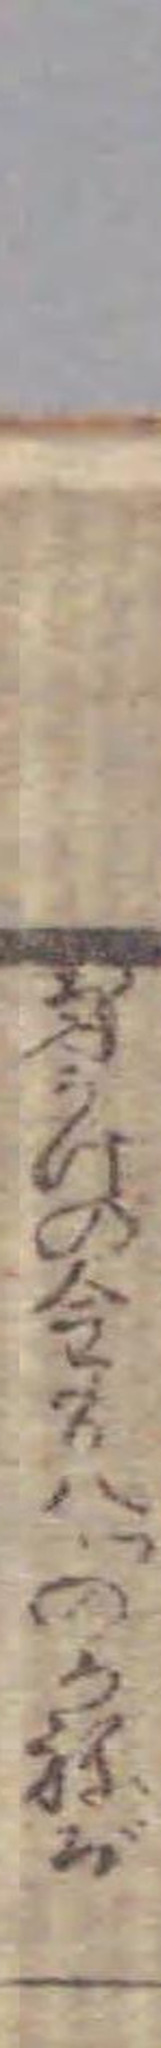お身うけの金も八
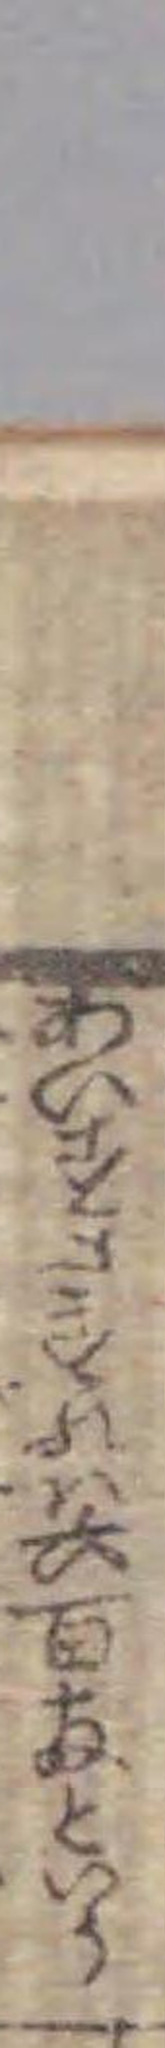あいすさすれは六百両という
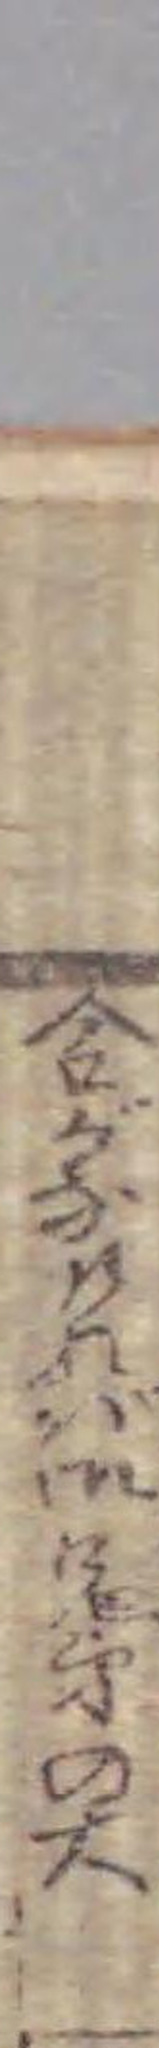金がなければ御兄弟の大
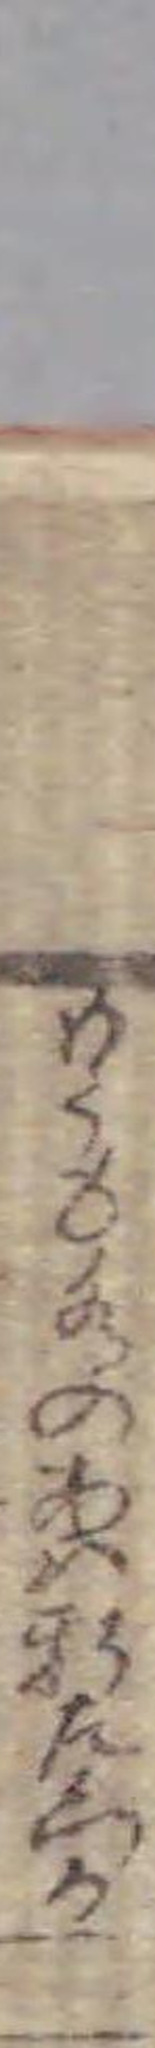もうも水のあは新左衛門か
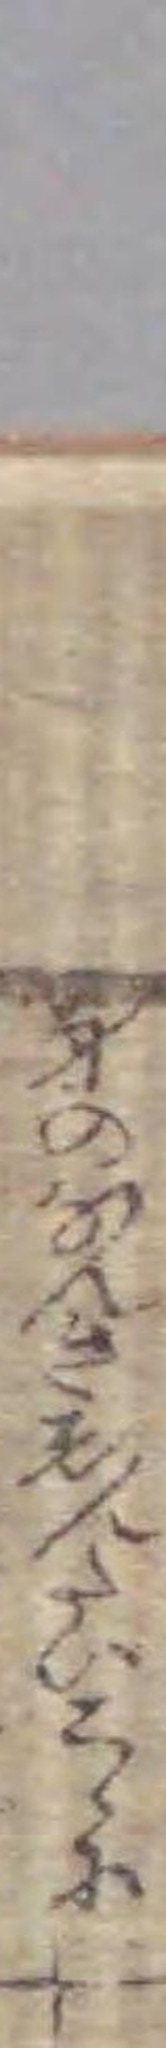身のなんきしんたいこゝに
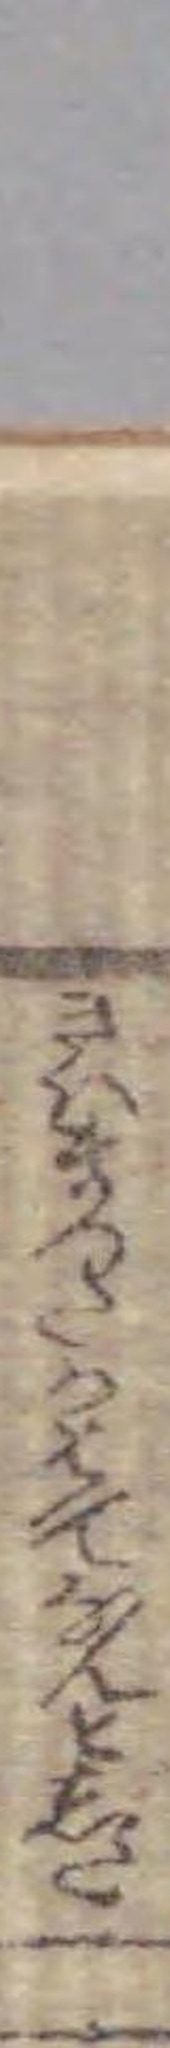きはまつたかはてなんとした
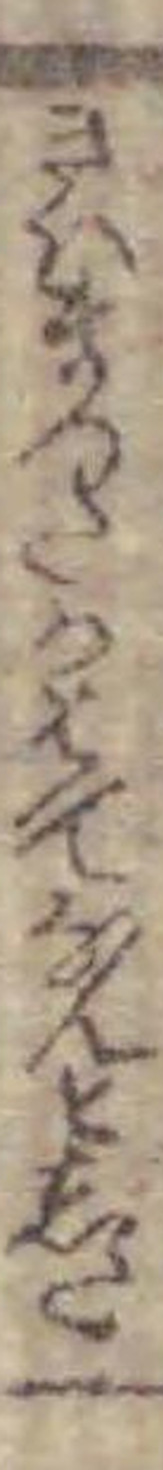きはまつたかはてなんとした
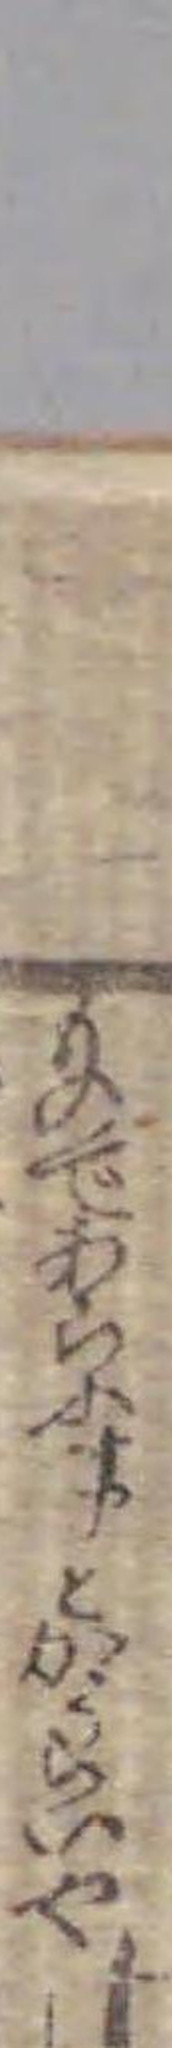ものであらふ
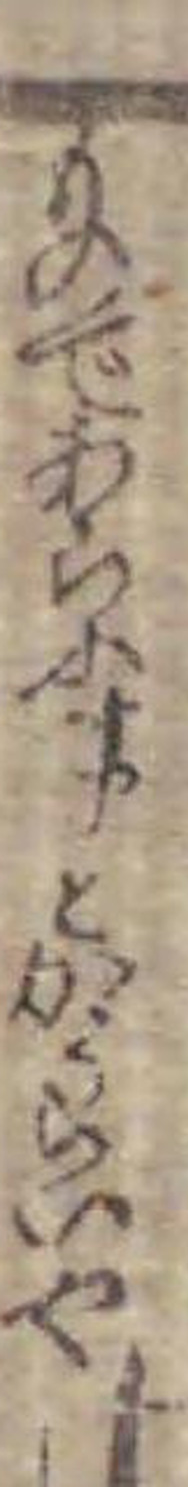ものであらふ
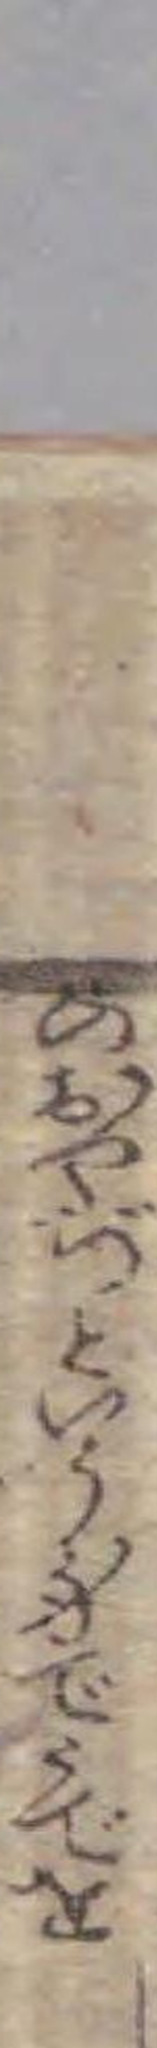のおやぢという身でうでを
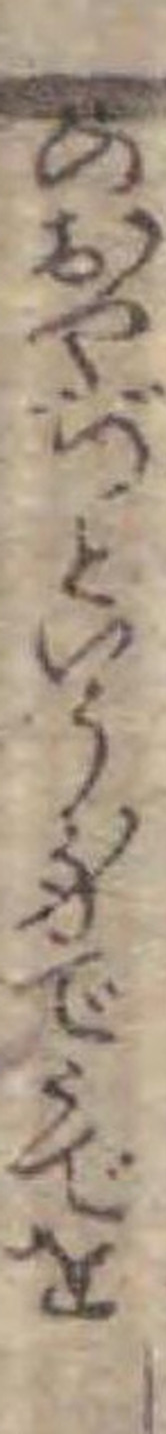のおやぢという身でうでを
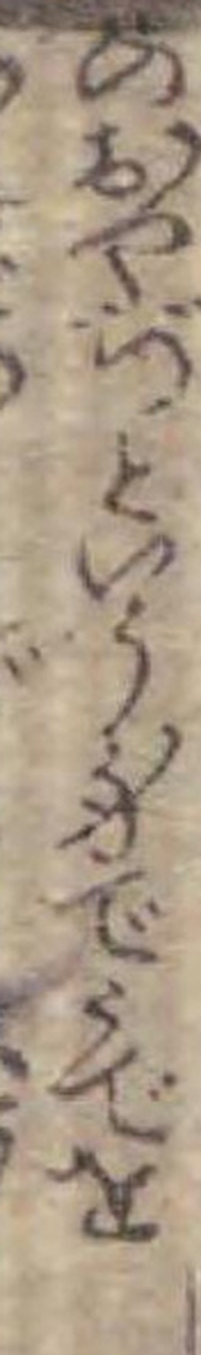のおやぢという身でうでを
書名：年寄之冷水曽我 : 3巻
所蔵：国立国会図書館 National Diet Library, JAPAN
